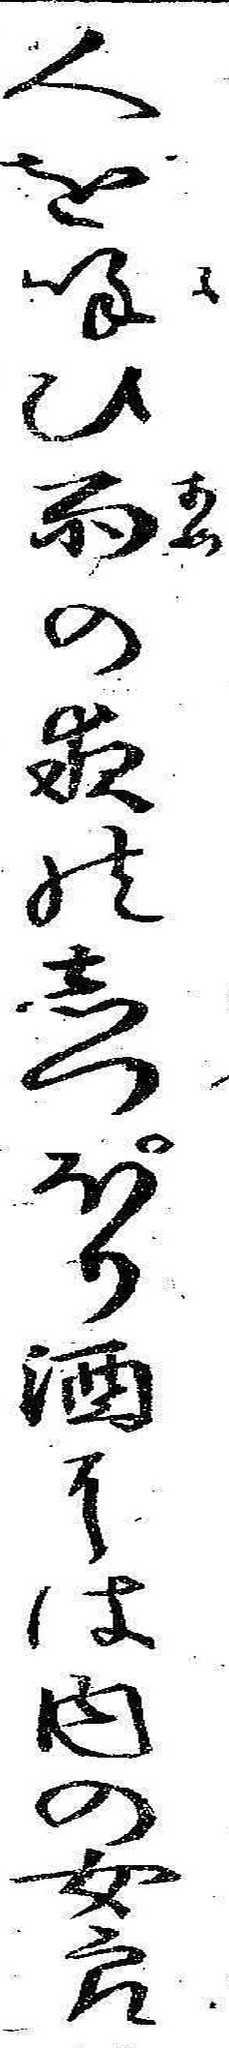人を呼ひ雨の夜のしつぽり酒には内の女郎
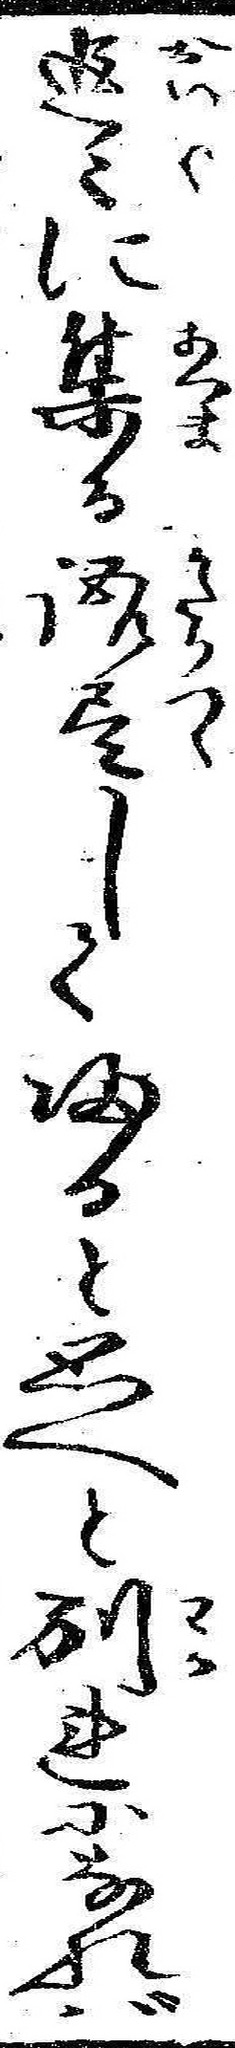追々に集る語尽して帰ると思へと別れになれば
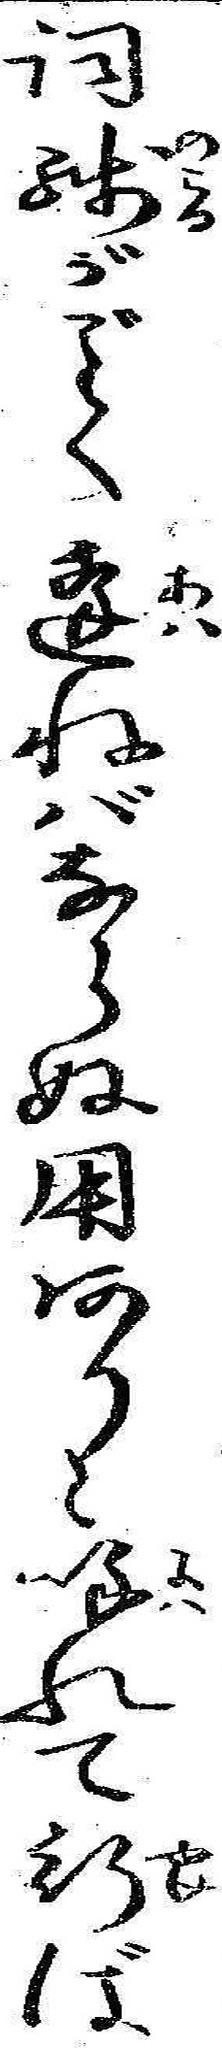詞残がごとく逢ねばならぬ用ありと呼れて行ば
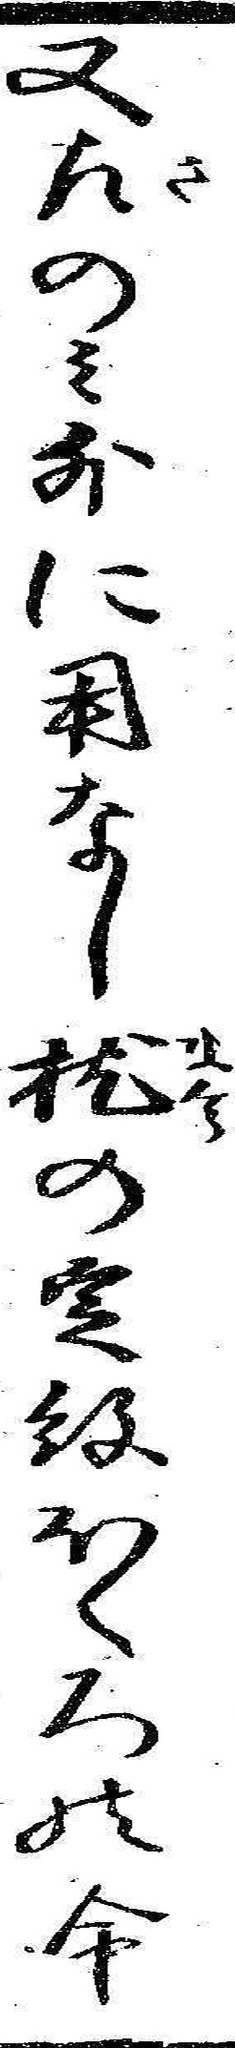又左のみ外に用なし枕の定紋ほくろの命
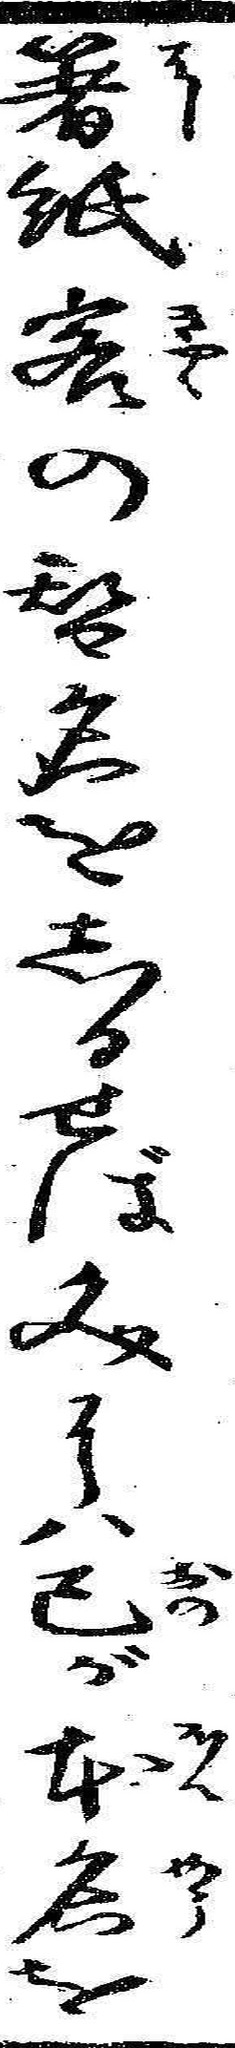箸紙客の替名をしるせば文には己が本名を
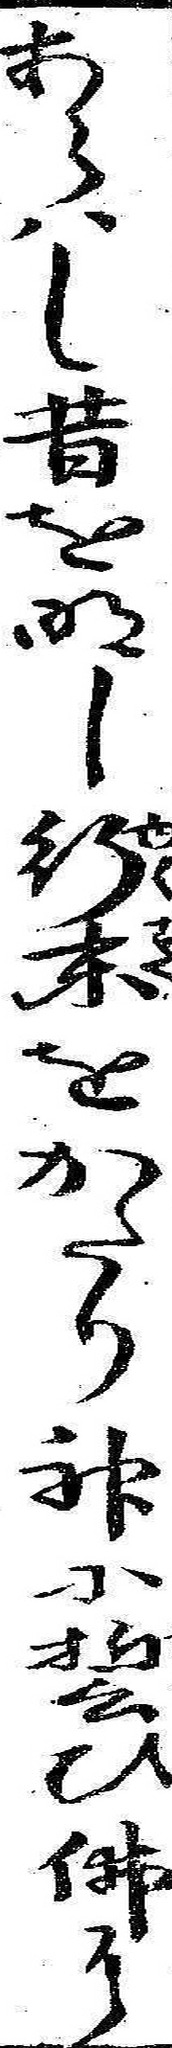あらはし昔を明し約束をかたり神に誓ひ仏に
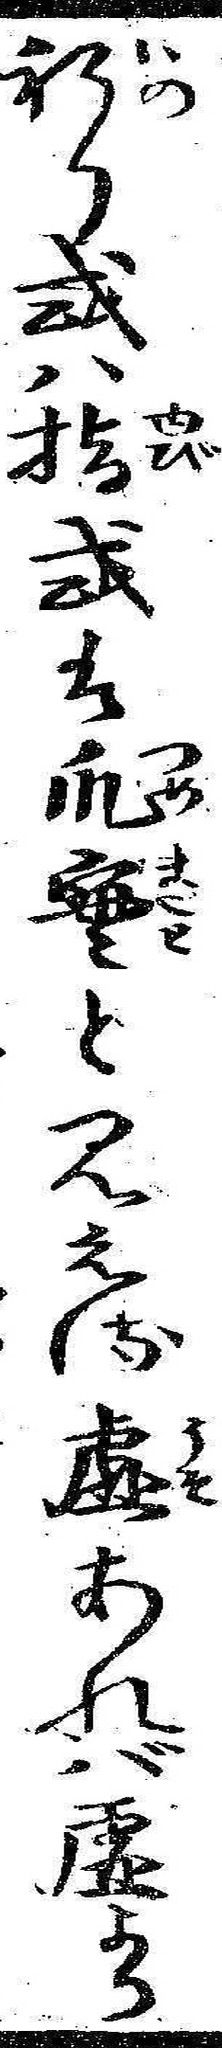祈り或は指或は爪実と見える虚あれば虚より
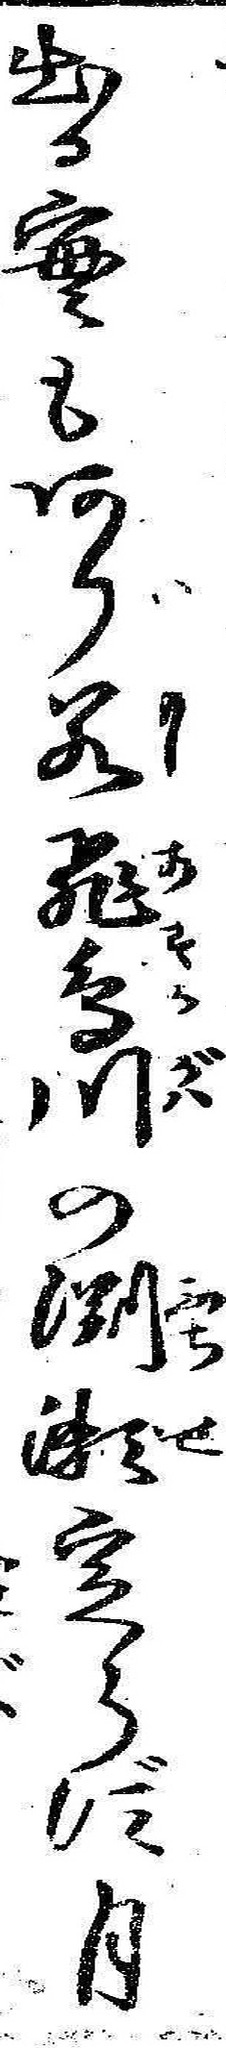出る実もあり若飛鳥川の淵瀬定らず月
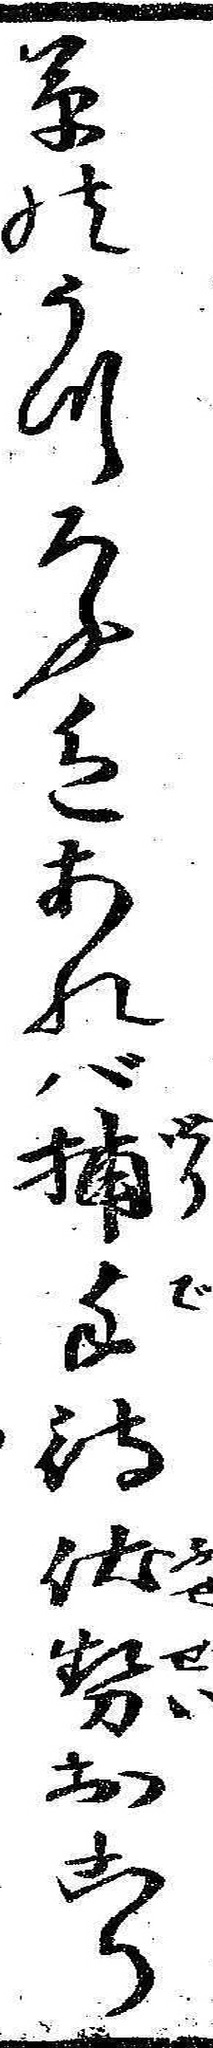草のうつろふ色あれば捕手待伏勢おこり
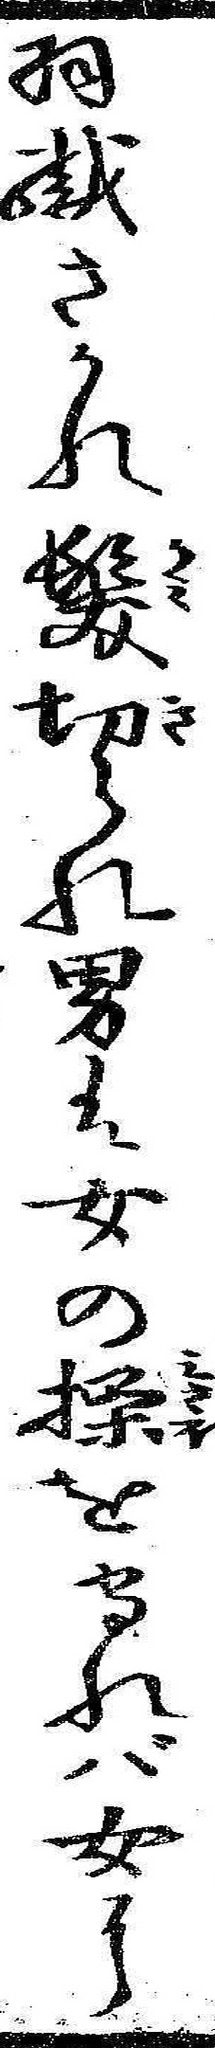羽織さかれ髪切られ男は女の操を守れば女に
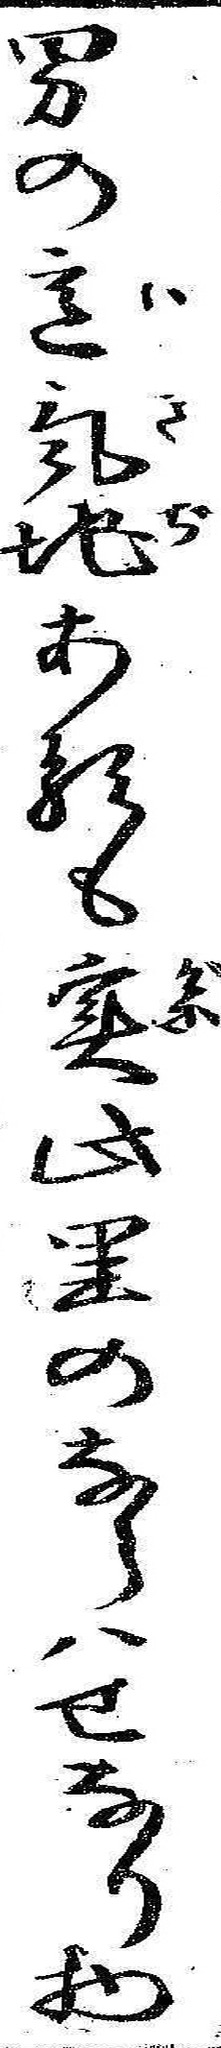男の意気地あるも実此里のならはせなり物
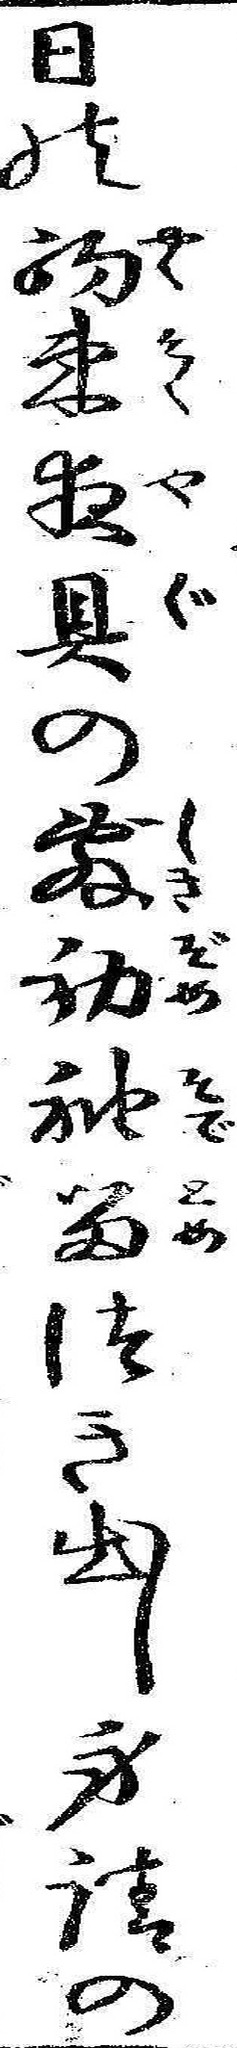日の約束夜具の敷初袖留つき出し身請の
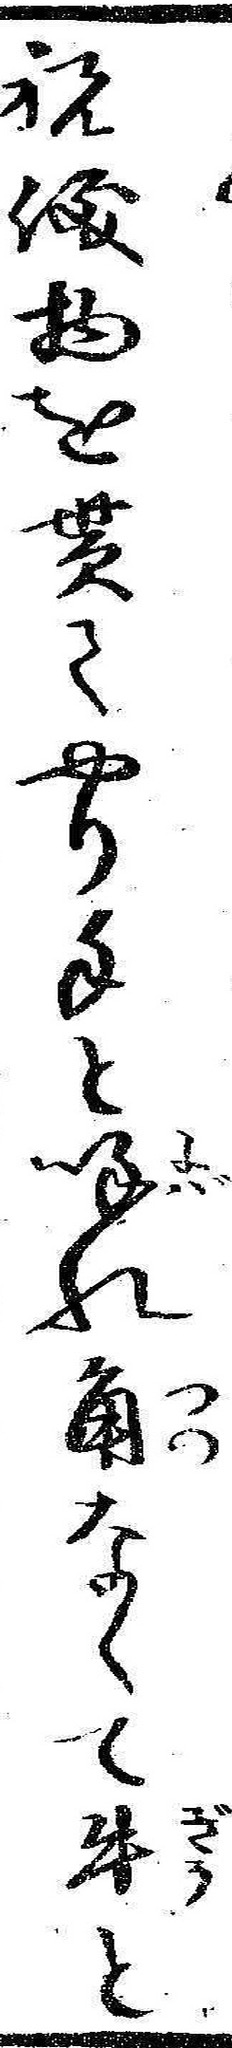祝儀物を貰てやり手と呼れ角なくて牛と
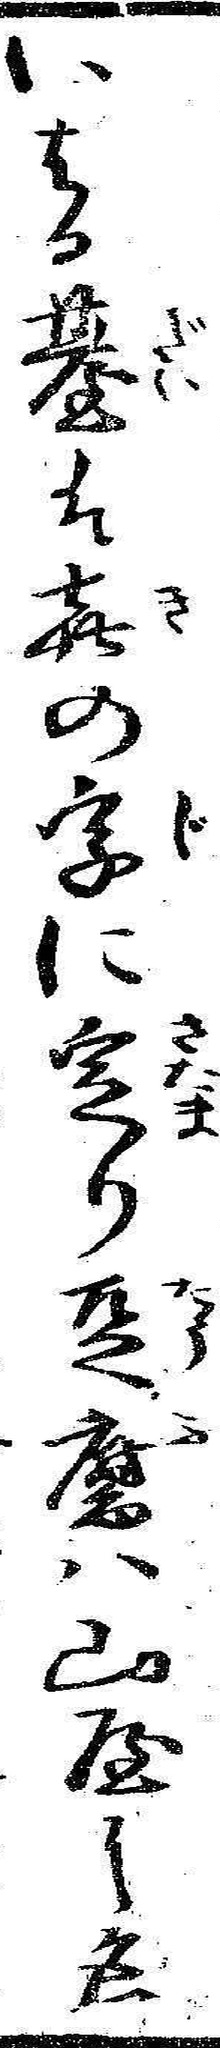いはる台は喜の字に定り豆腐は山屋に名
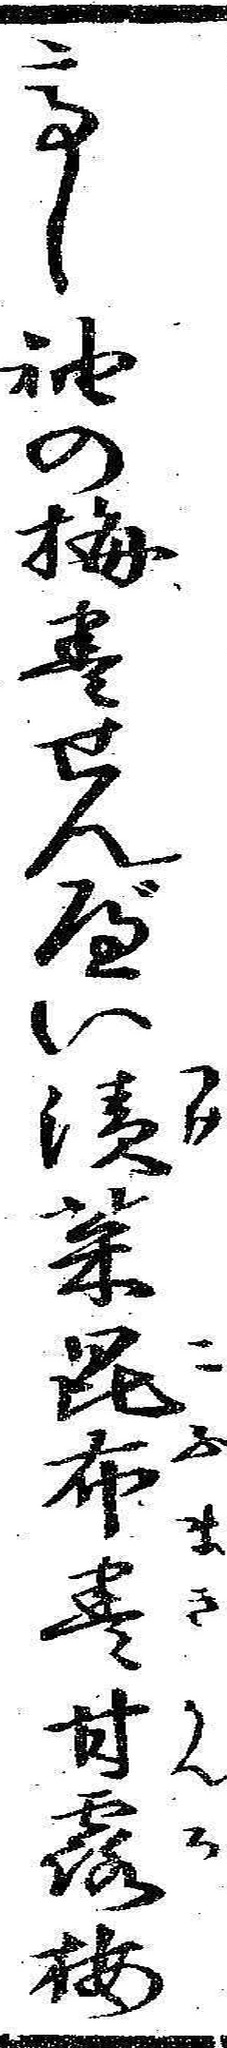高し袖の梅巻せんべい漬菜昆布巻甘露梅

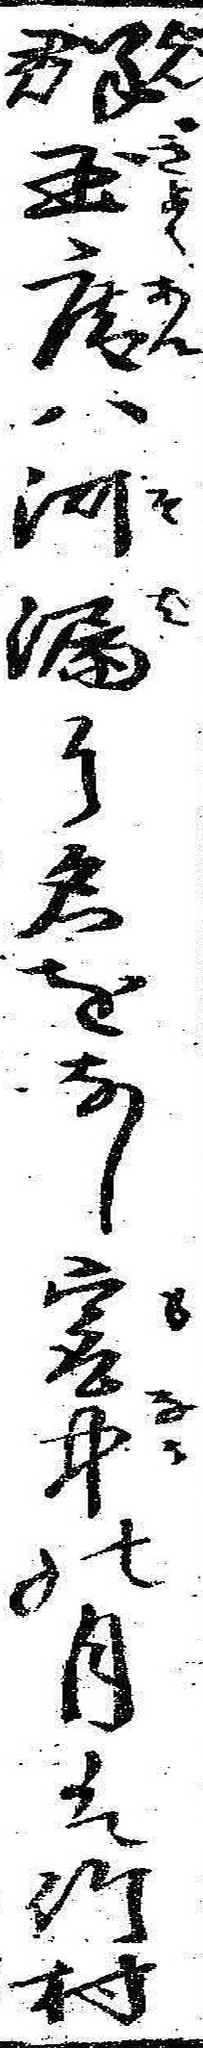群玉庵は河漏に名をなし最中の月は竹村
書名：根無草後編
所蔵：国文学研究資料館
